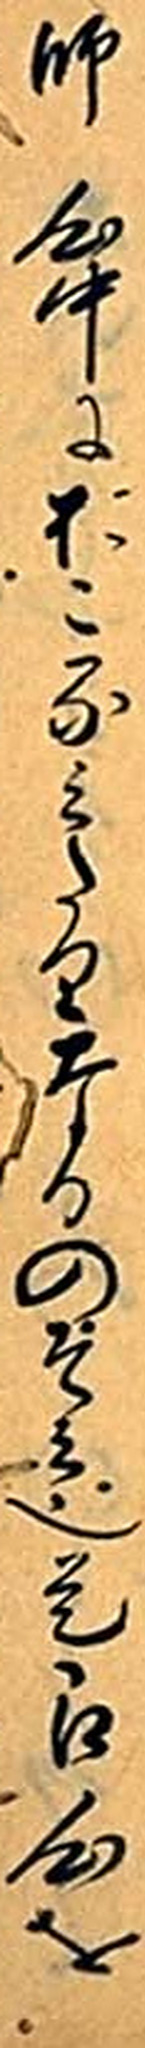師心中におこるみたりなるのそみ也是即心を
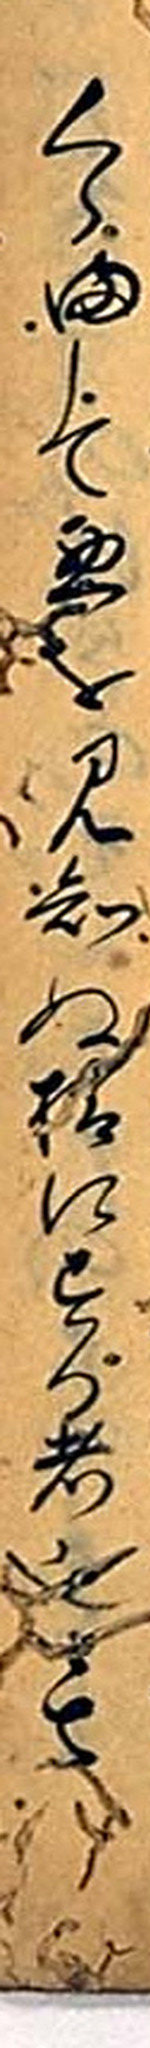くらまして悪を見知ぬ様にする者其

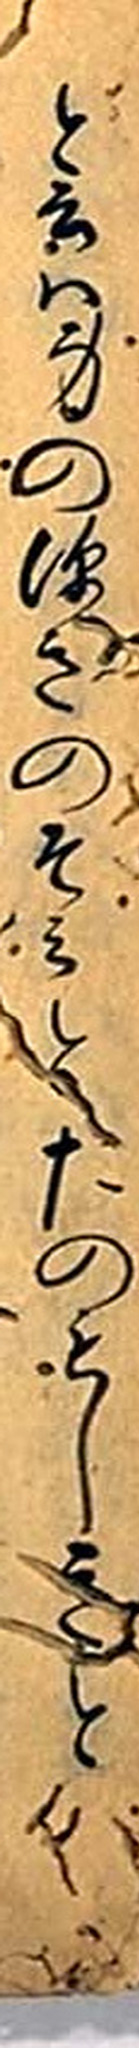と云は身の深きのそみとたのもしきと
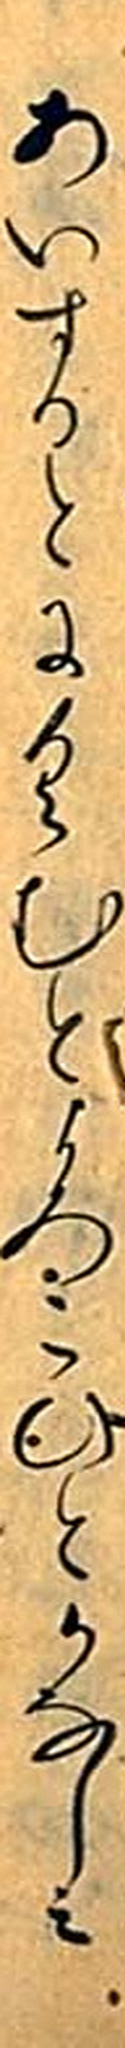あいするとにくむとよろこひとかなしみ
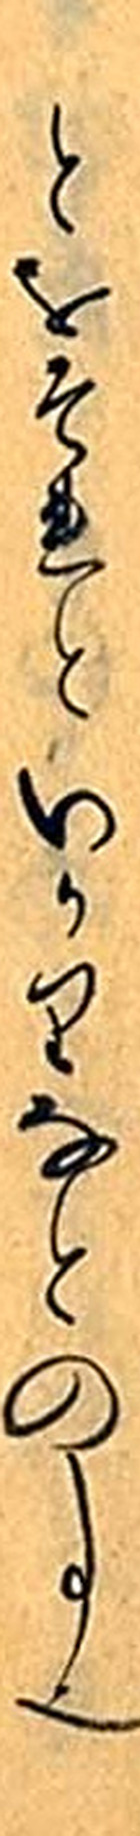とをそれといかりなとの事也
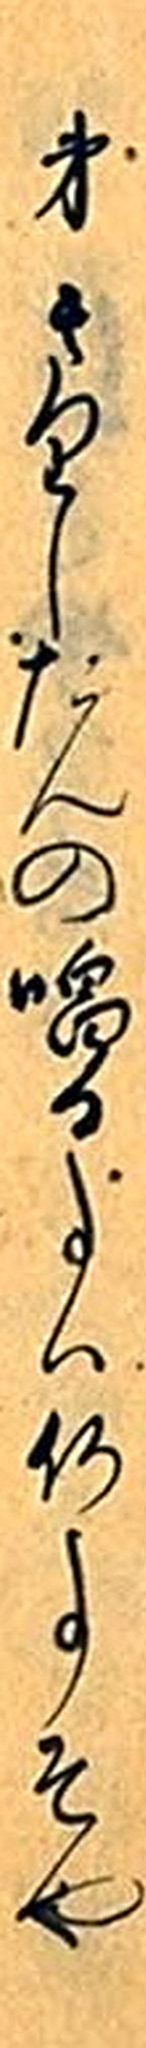弟きりしたんの唱る事は何事そや
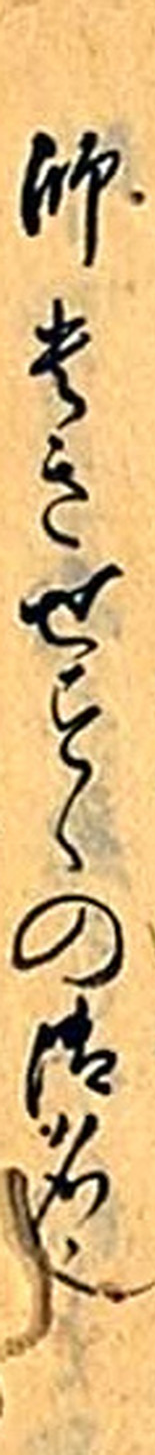師貴きせすゝの御名也
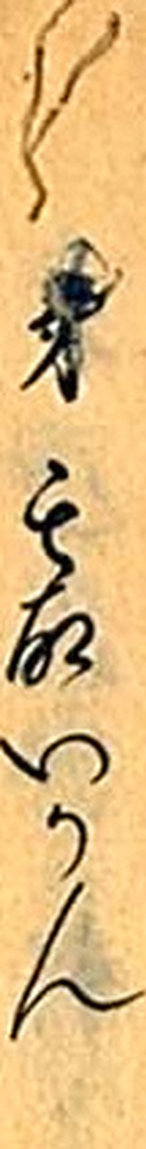弟其故いかん
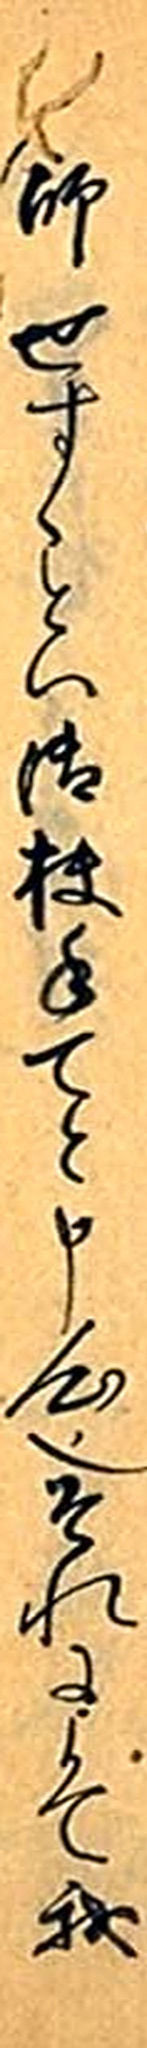師せすゝとは御扶手てと申心也それによて我
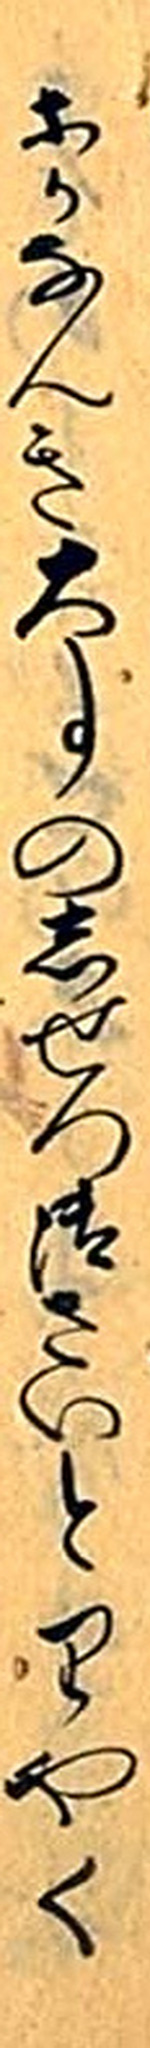らかなんき大事のしせつ御さいとりやく
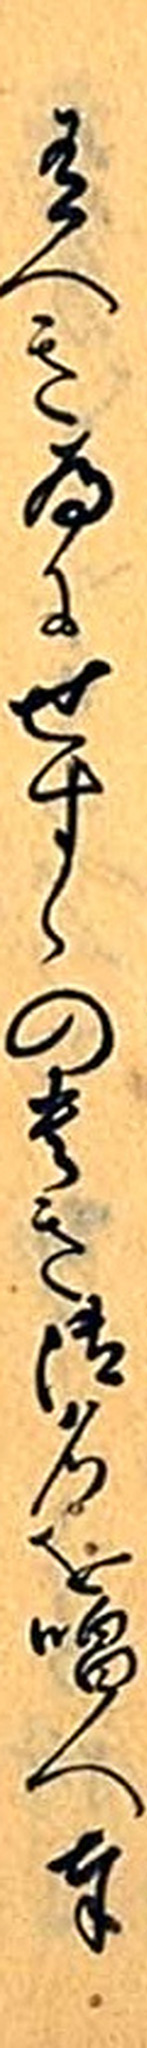有へき為にせすゝの貴き御名を唱へ奉
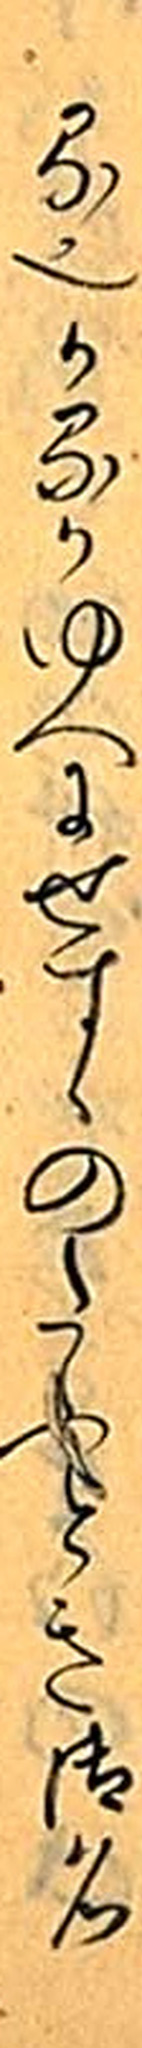る也かるかゆへにせすゝのたふとき御名
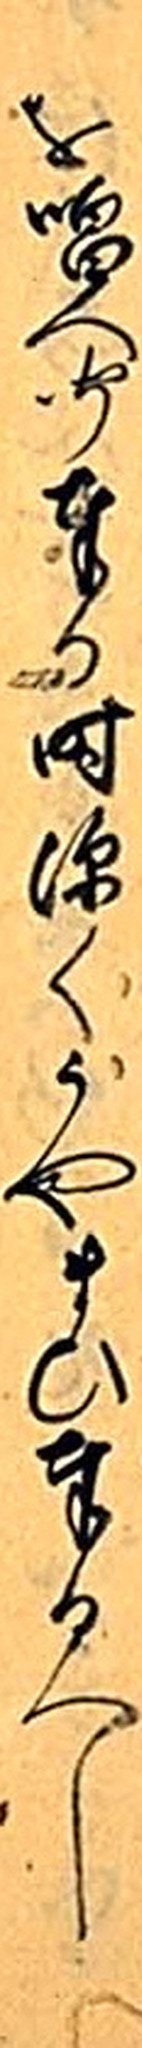を唱へ聞奉る時深くうやまひ奉るへし
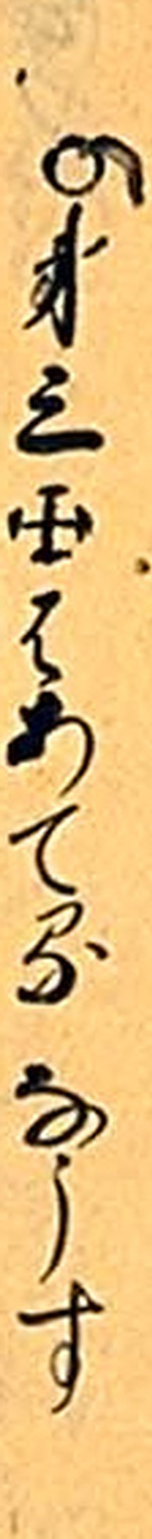○第三☩はあてるなうす
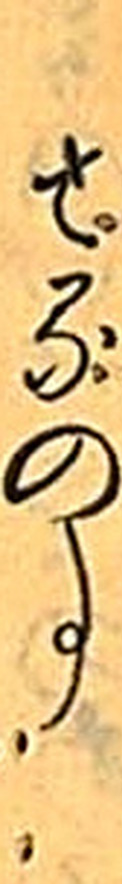てるの事
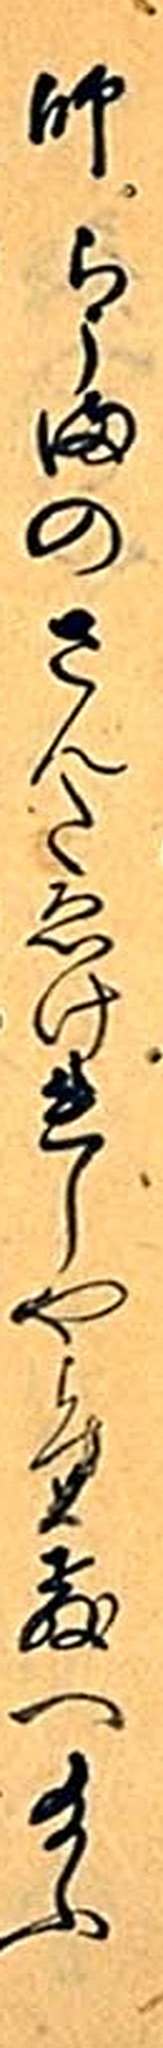師らうまのさんたゑけれしやより教へ給ふ
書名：ドチリナ・キリシタン
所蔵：東京大学総合図書館 / General Library in the University of Tokyo
